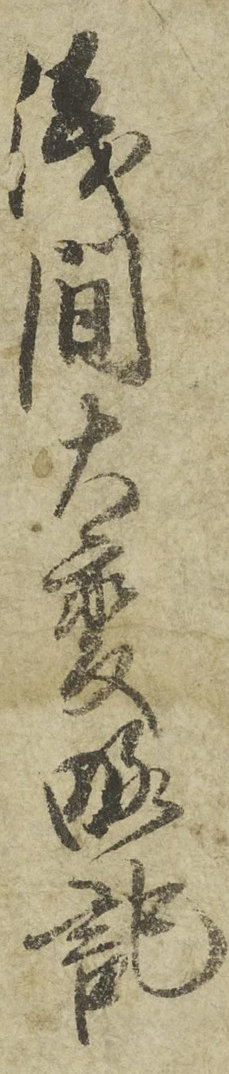浅間大変略記
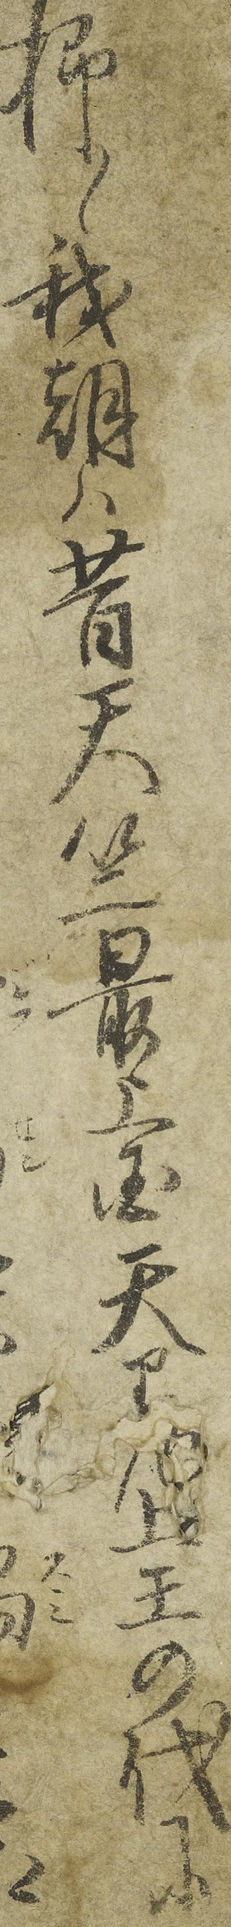抑〳〵我朝は昔天竺最上国天りん上王の代に
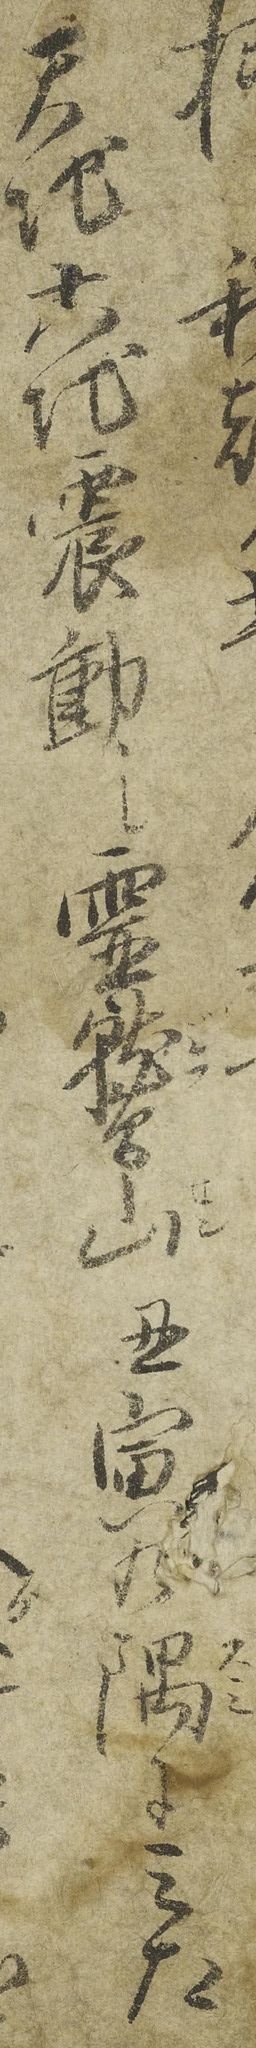天地六地震動し霊鷲山丑寅の隅にみた
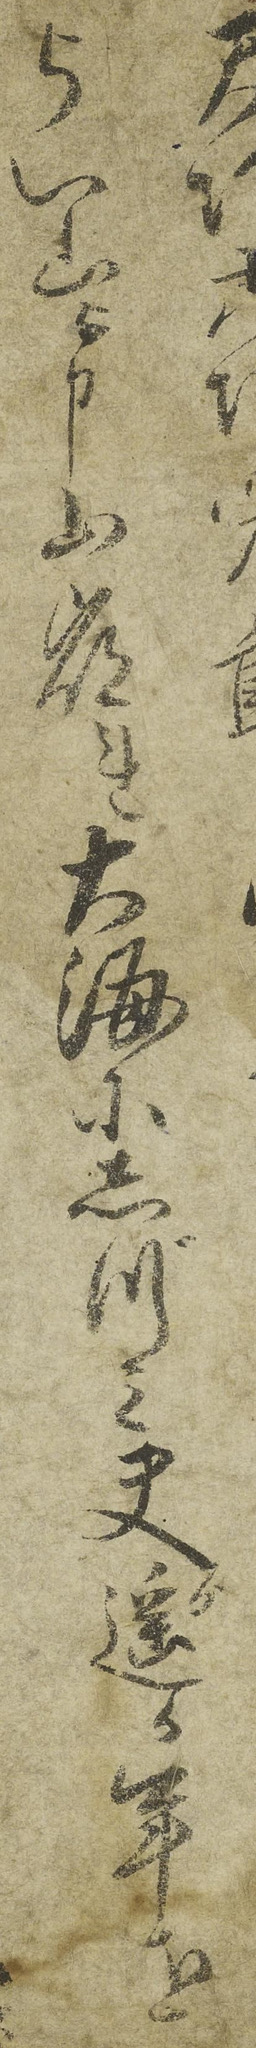らい山と申山崩れ大海にしづみ夫ゟ遥か年を
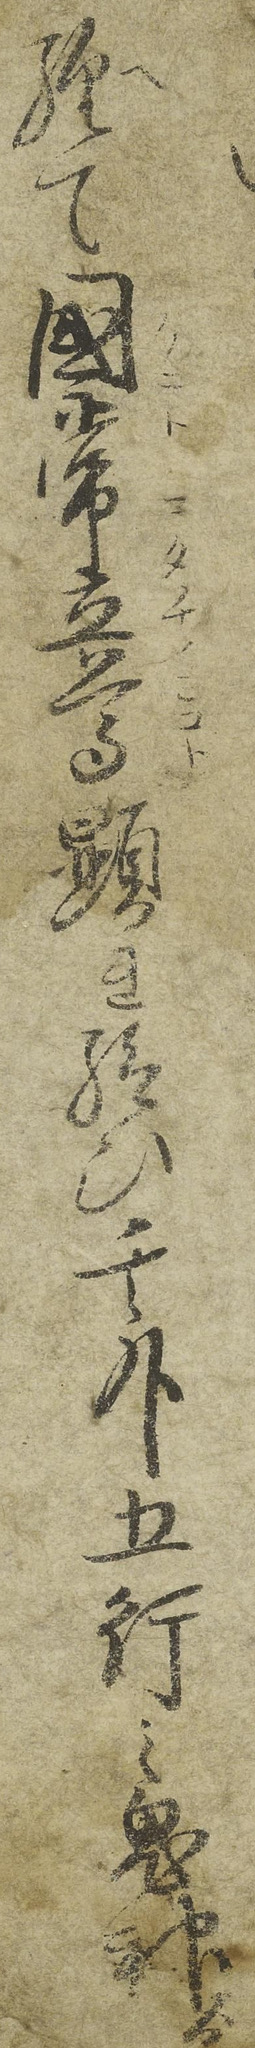経て国常立尊顕れ給ひ其外五行の鬼神ゟ
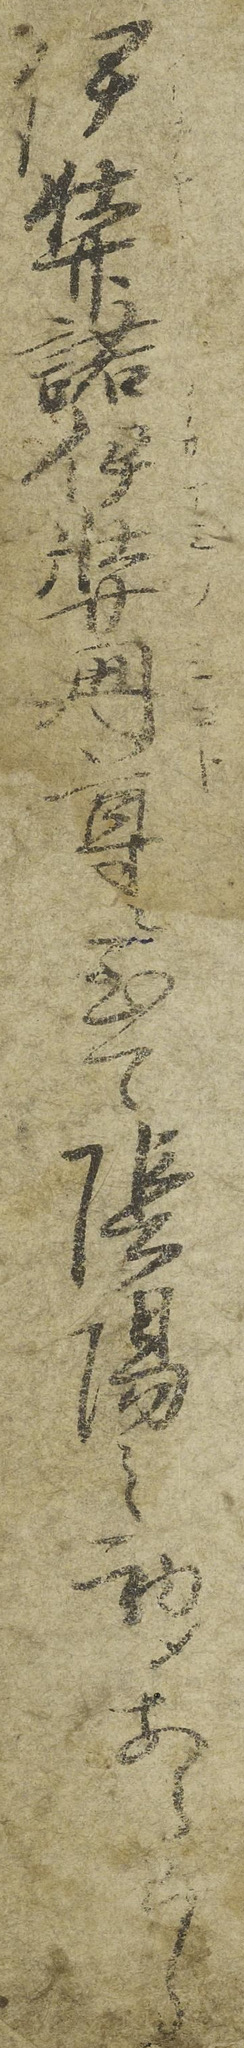伊弉諾伊弉冉尊に至て陰陽之勤メあらはれ

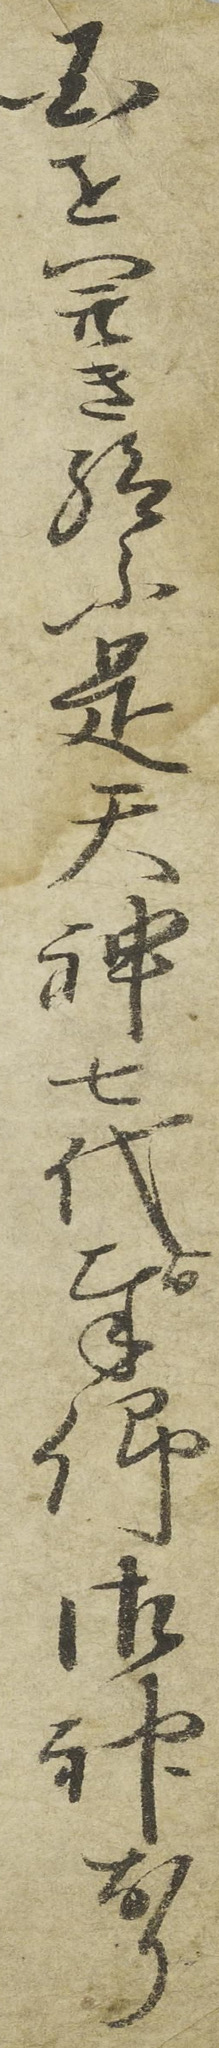国を開き給ふ是天神七代より奉抑御神なり
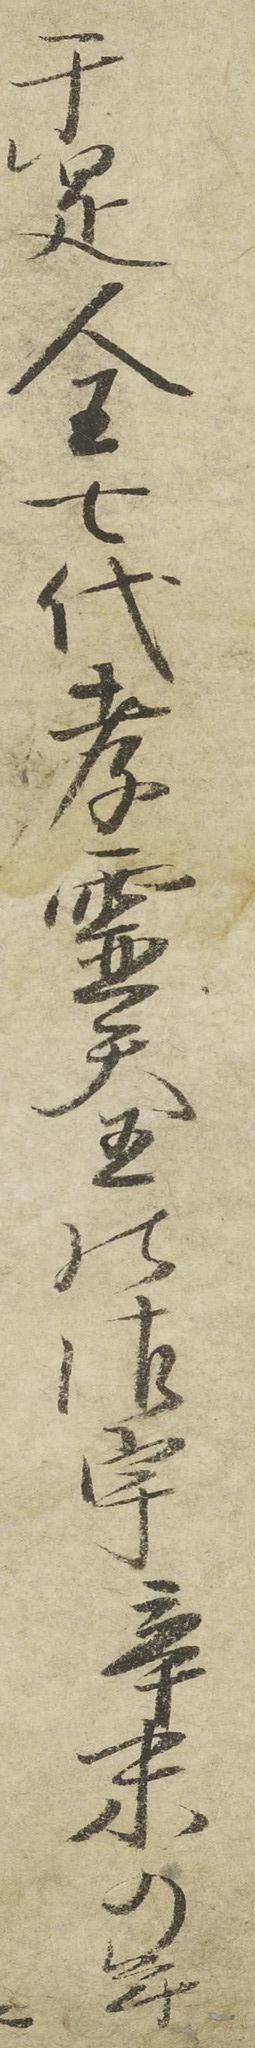于足人王七代孝霊天王の御宇辛末の年
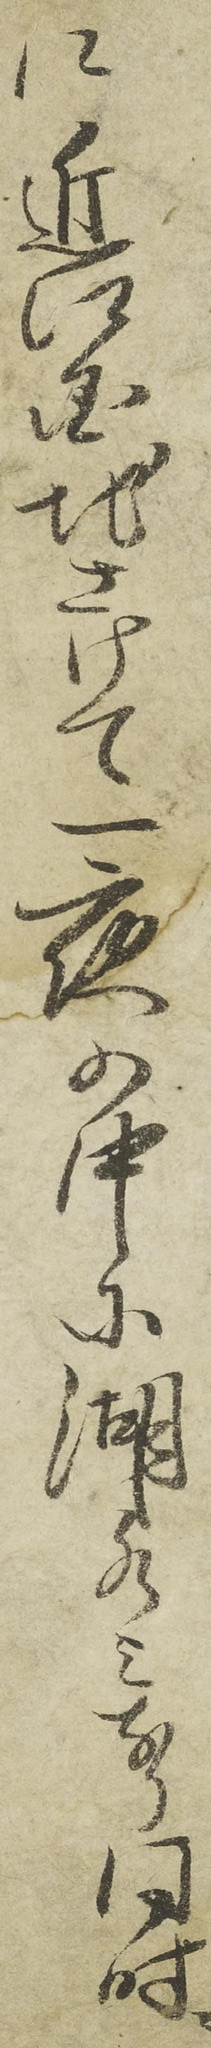に近江国地さけて一夜の中に湖水与なり同時に
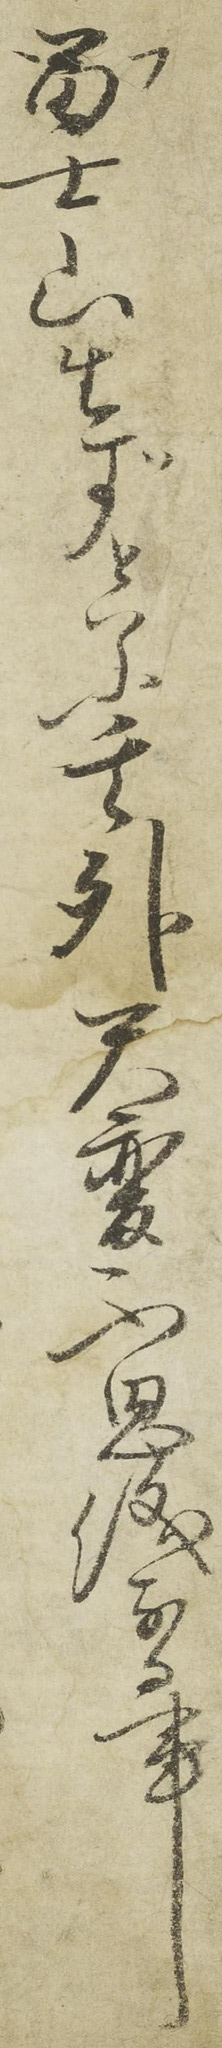富士山生ずといふ其外天変不思議なる事
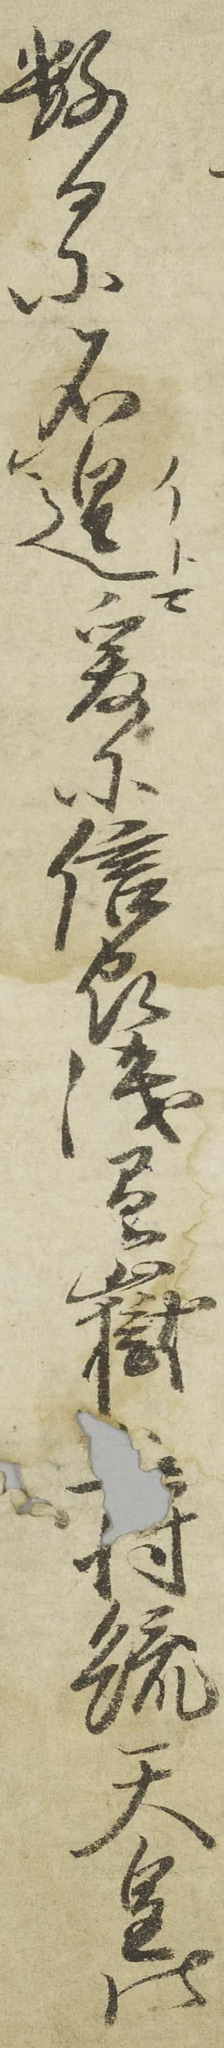数るに石遑爰に信州浅間は嶽上持統天皇の
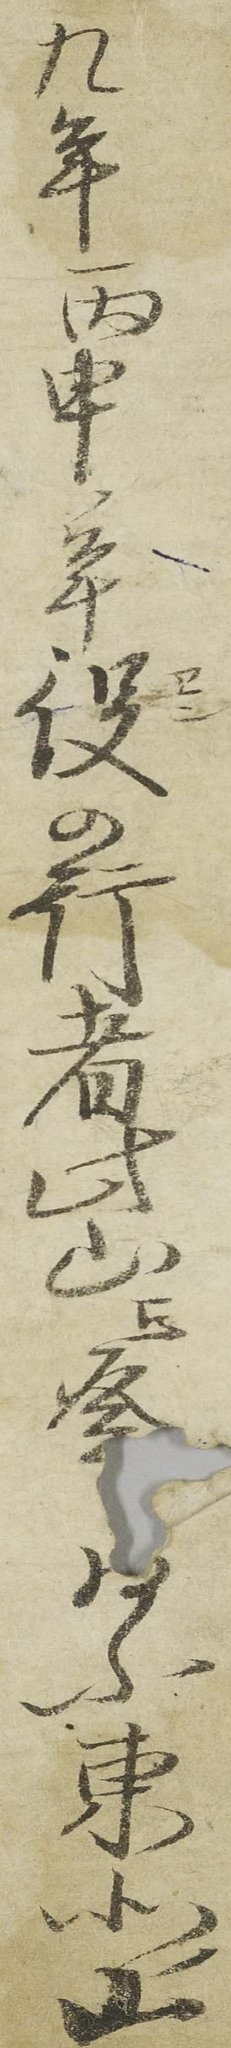九年丙申年ノ役の行者此山江登給ふ東北の山
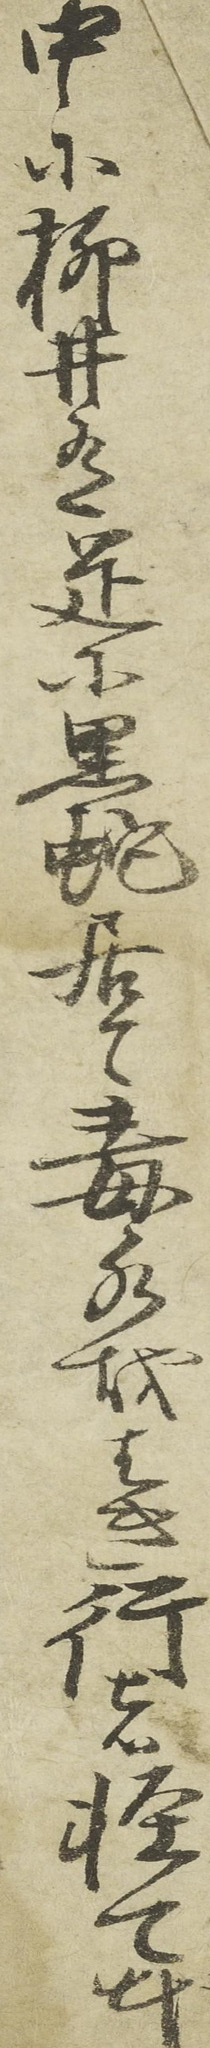中に柳井有足に黒蛇居て毒水をはき行者怪て本
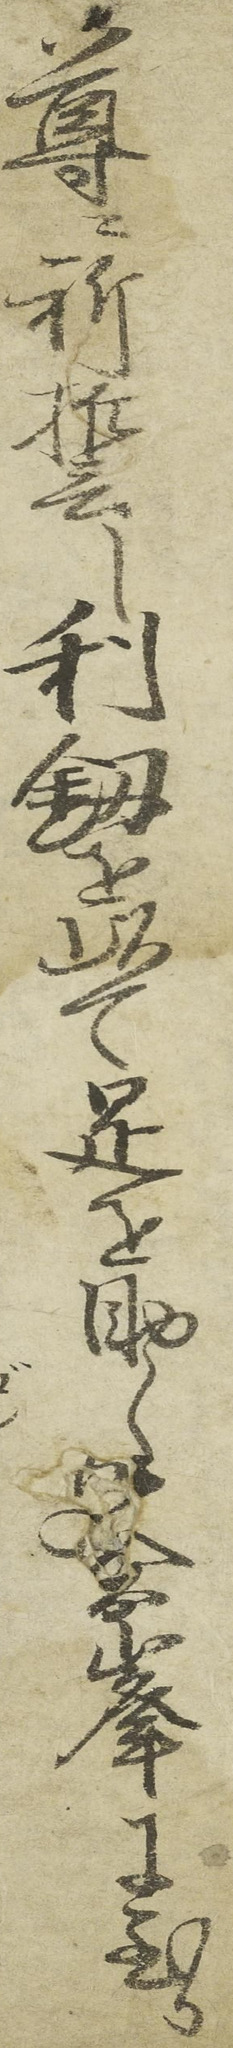尊に祈誓し利剣を以て足を助くそれゟ峯に至り
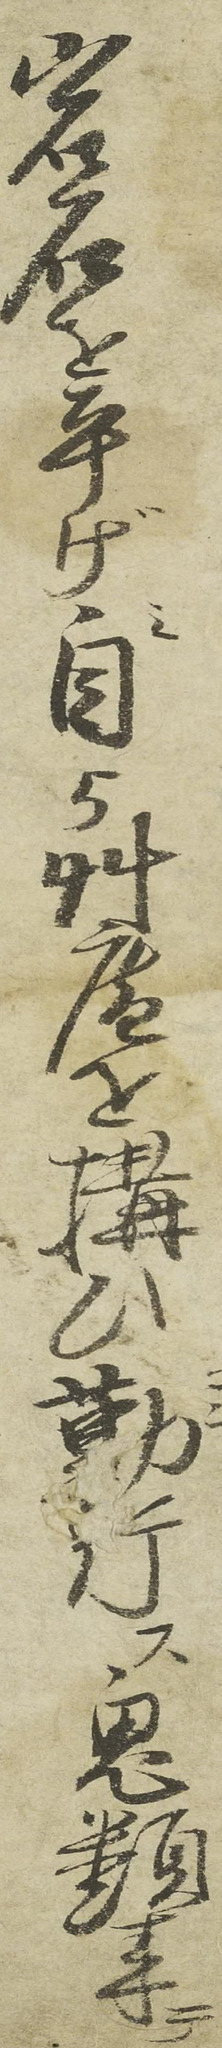岩石を平げ自ら草庵を構ひ勤行す鬼類来て
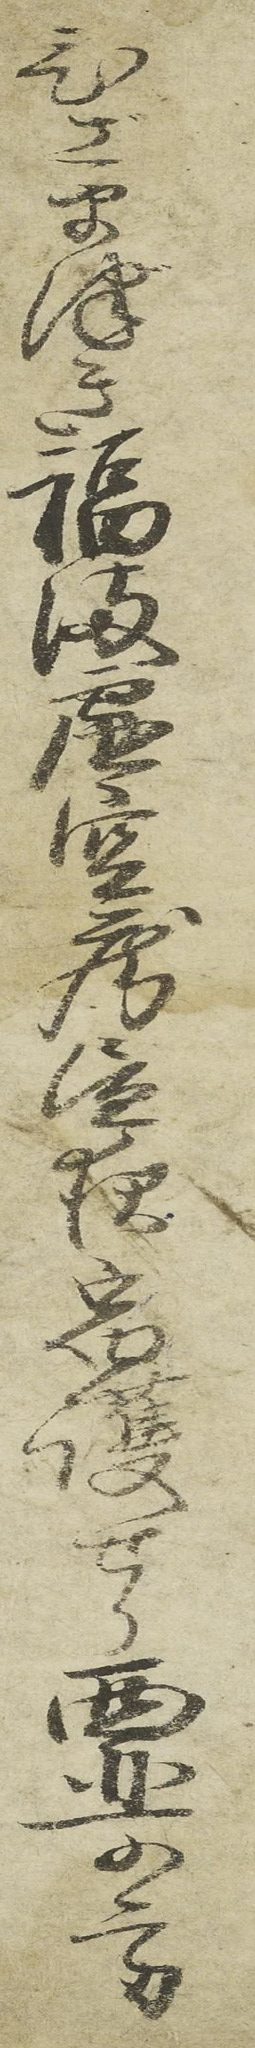ひざまづき福満虚空蔵昼夜当獲せり西北の方
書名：浅間大変略記
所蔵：東京大学地震研究所図書室 Earthquake Research Institute Library, The University of Tokyo, JAPAN
